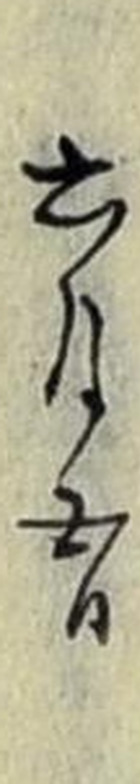六月五日
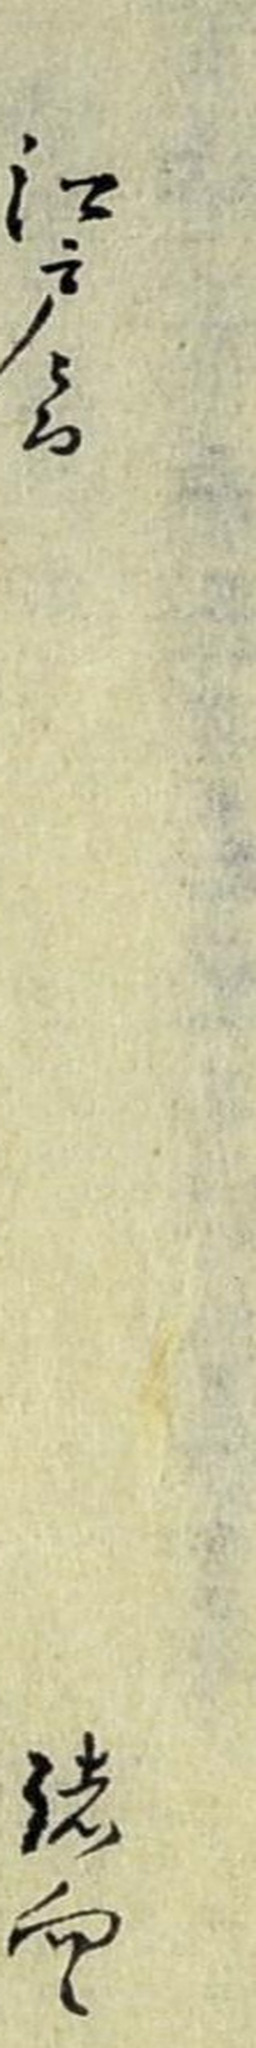江戸に而諸向へ
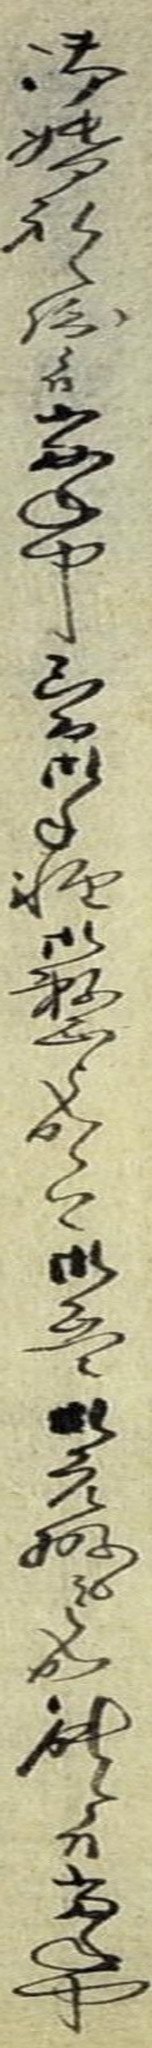〇御婚礼之儀に付当年中至而御手軽御整被成候はゝ御互に御取扱も被成能候に付当年中
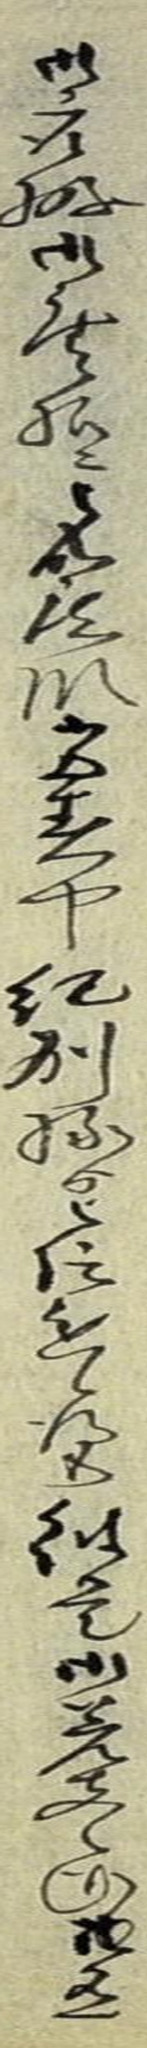御取扱御座候様に被成度段当春中紀州様ゟ被仰進候得共彼是御差支之趣共有
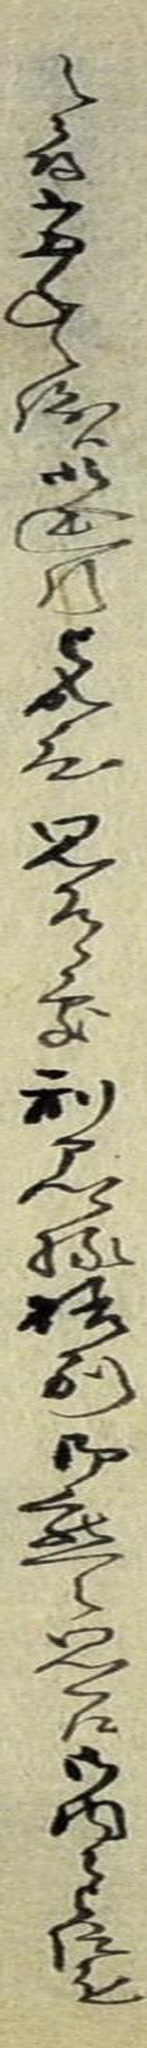之に付当年之儀は御延引被成度思召候処刑部卿様格別御懇之思召御内々被仰進
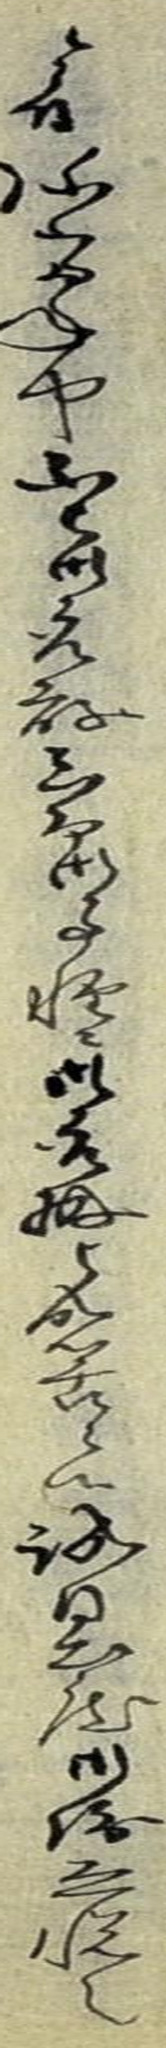候に付弥当年中不被御取扱至而御事軽に御取扱被成筈に候誠目出度御儀恐悦之
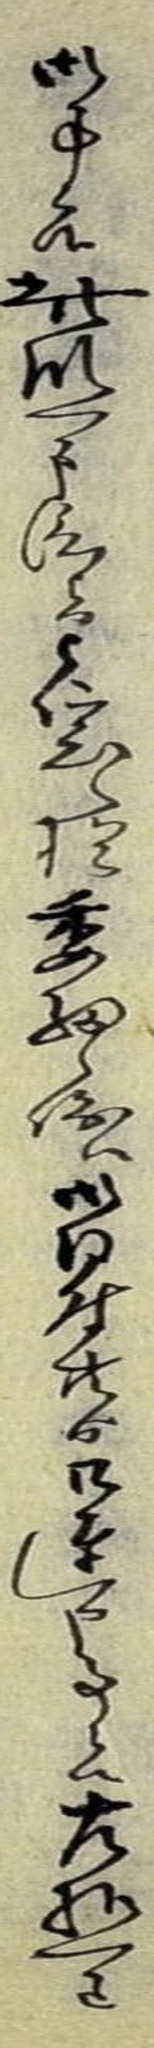御事に候此段可申渡旨被仰出之猶委細之儀は御目付共ゟ口達申事に候左様可被
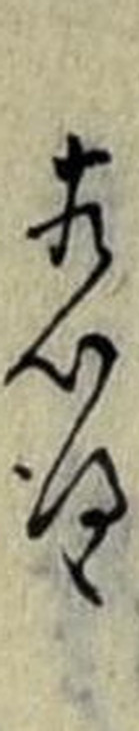相心得候
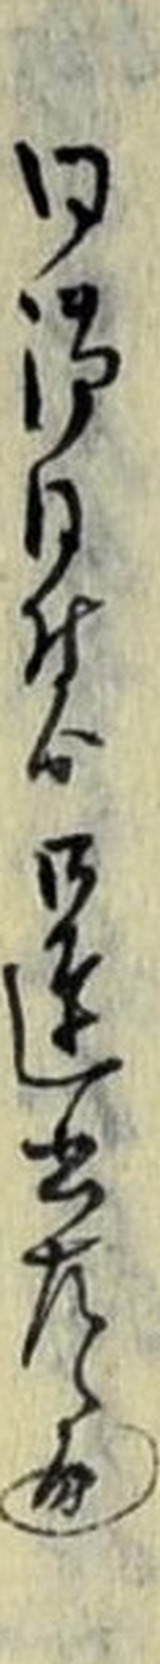同御目付ゟ口達書左之通
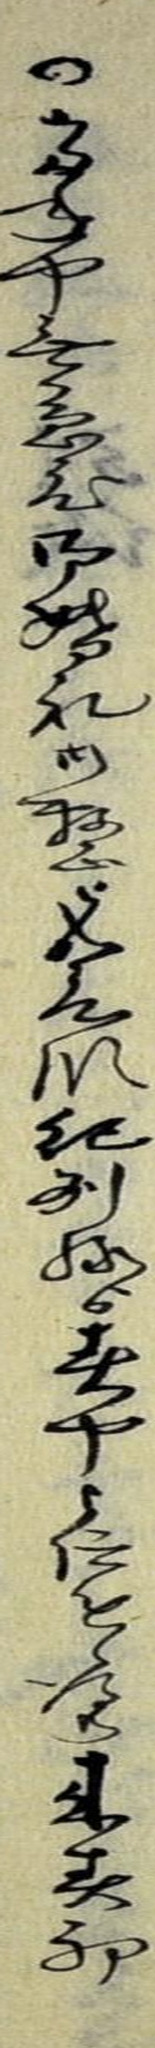〇当年中無急度御婚礼御整被成度段紀州様ゟ春中被仰進候得共来春初
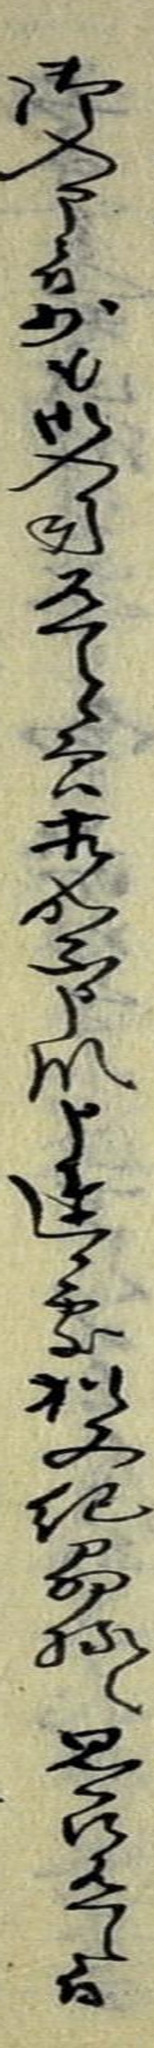御入部に付少も御入用有之候而は相成不申段申達候処猶又紀州様ヘ思召有之に付
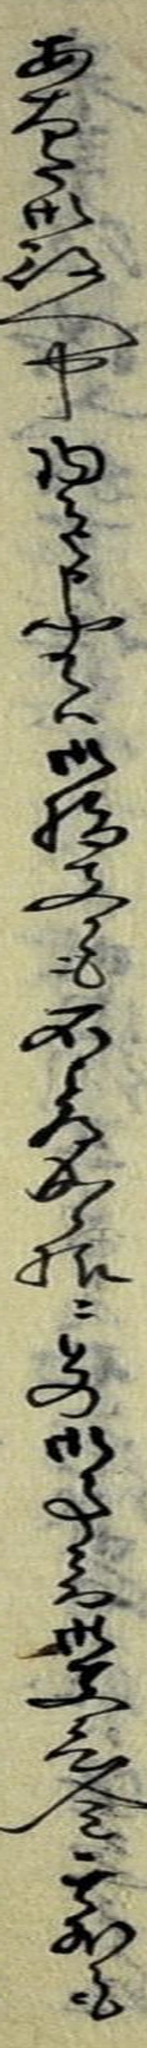あなた御役人中内々被申聞候は御指支も不被為成候様にとの御事に而御支度金其外にも
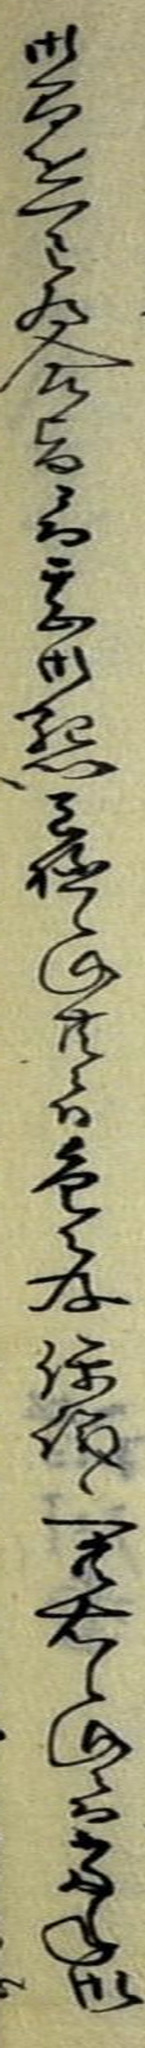御間を可被為合旨に而甚御懇至極之趣共に付色々及評議候へ共右之趣に而当年御
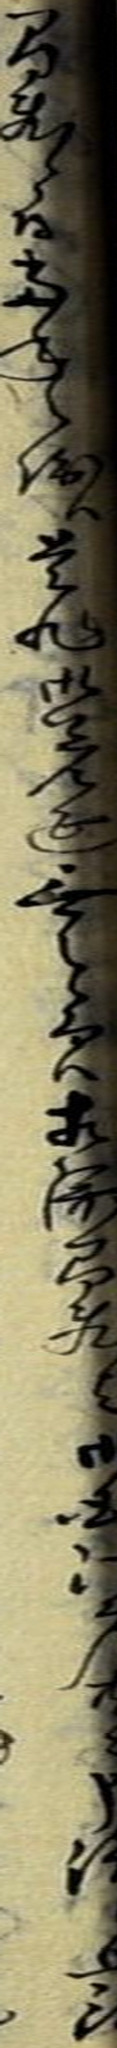間敷候に付当年之儀は是非差延無之候而は相済間敷と御国江戸共に申談之上致
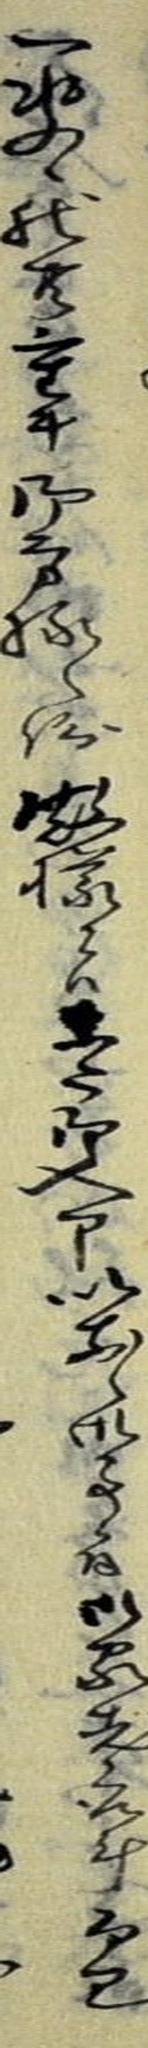一決候然共重き御方様之儀殿様には未た御入部以前之御事に付御家老取斗而己
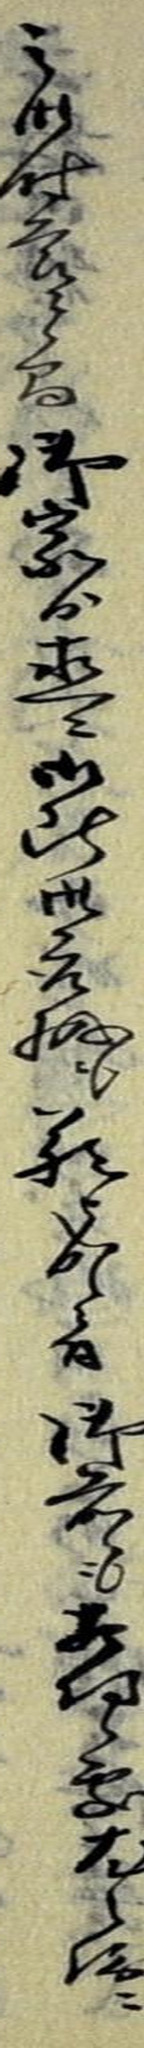之御時節に候間御家ゟ直に御断御取扱も難被成候に付御前へも相伺候処尤之儀に
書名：命令之部 二
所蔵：福井県文書館 Fukui Prefectural Archives
